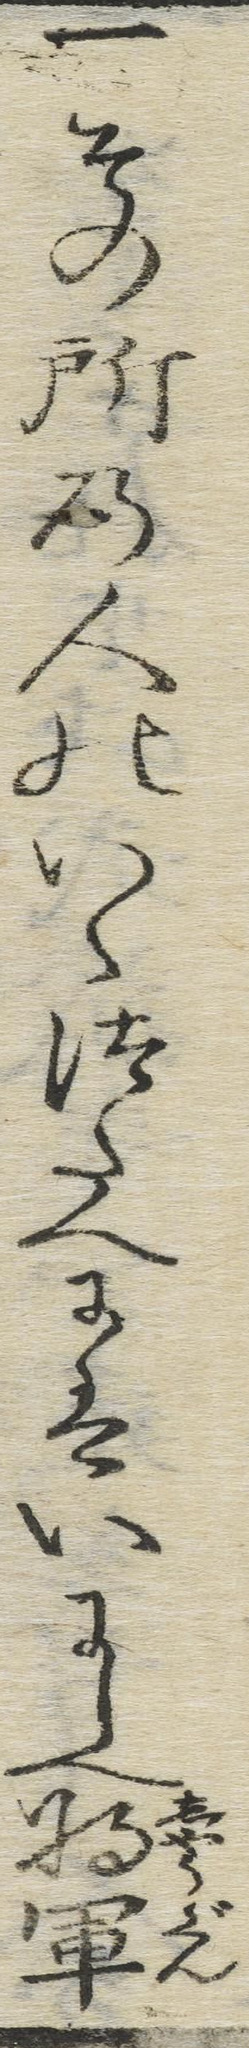一その所の人のいゝつたへにはいにしへ将軍
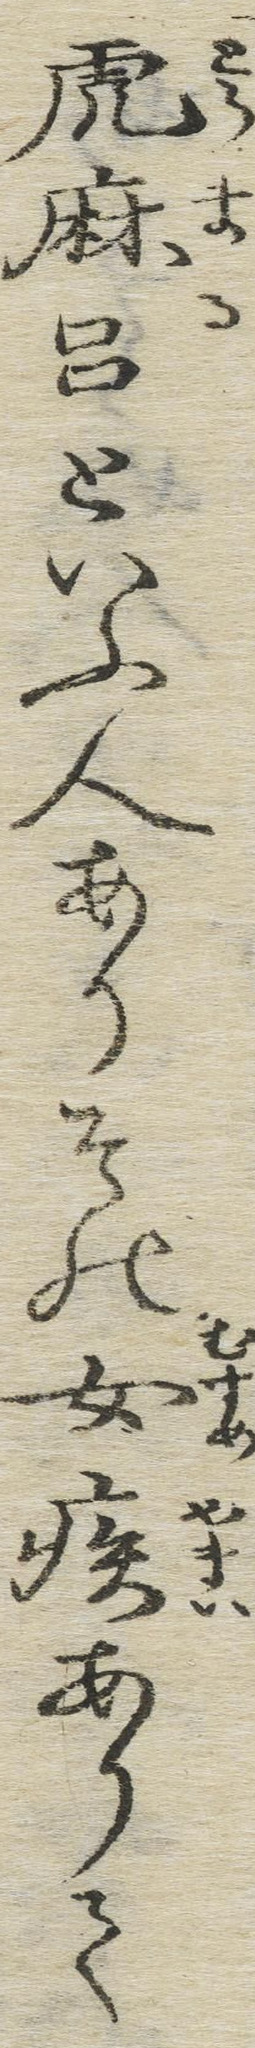虎麻呂といふ人ありその女疾ありて
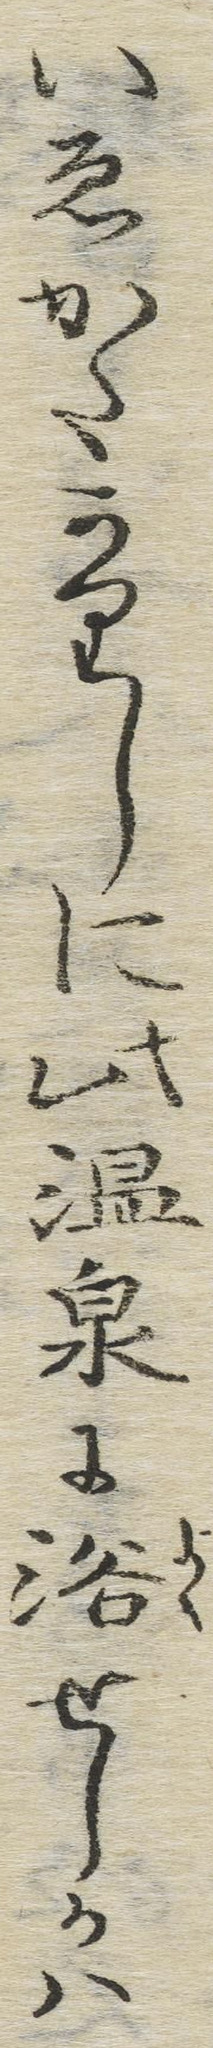いゑかたかりしに此温泉に浴せしかは
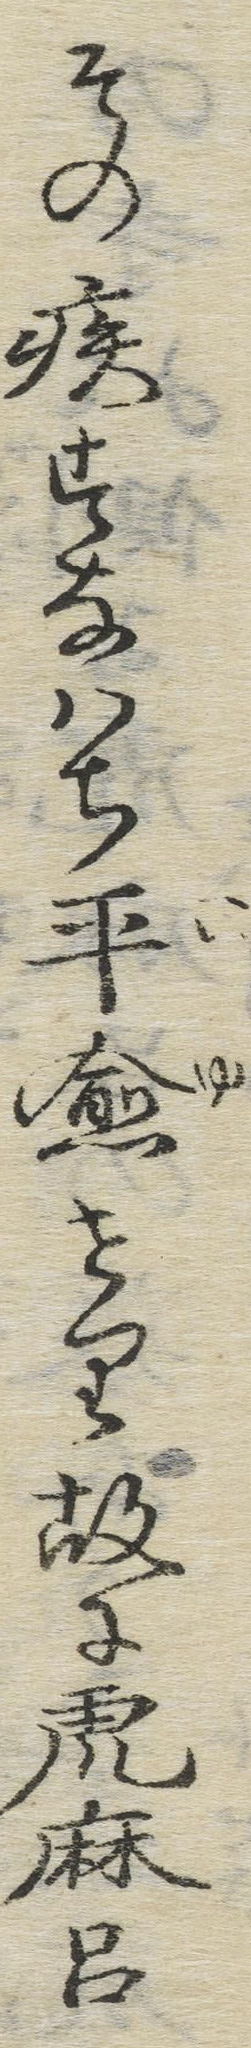その疾すなはち平愈せり故に虎麻呂
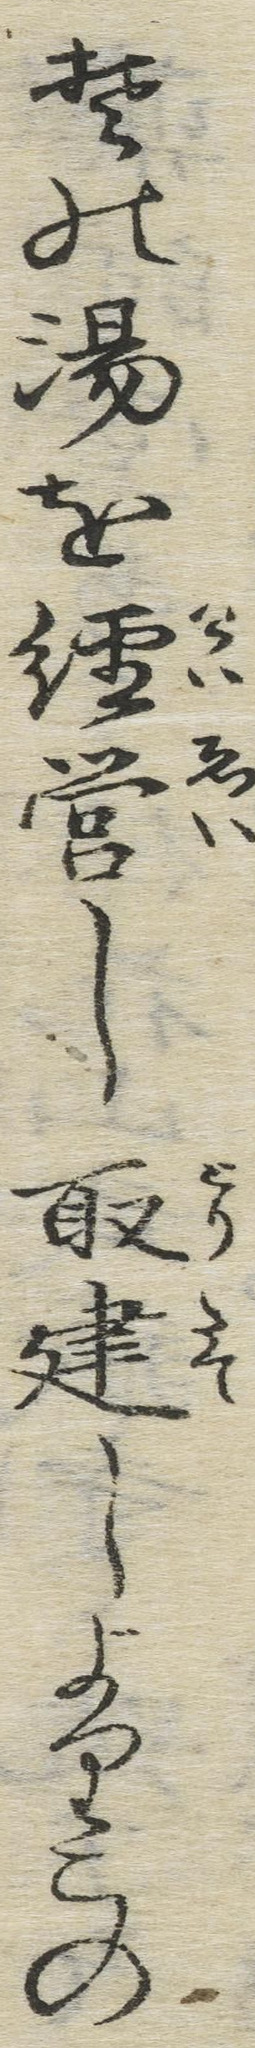その湯を経営し取建しよりこの
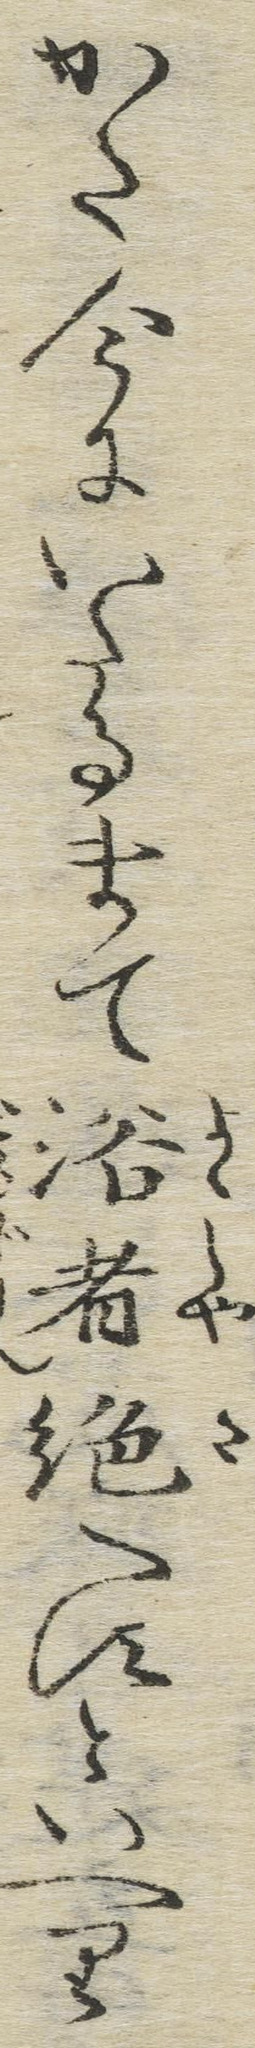かた今にいたるまて浴者絶へすといへり
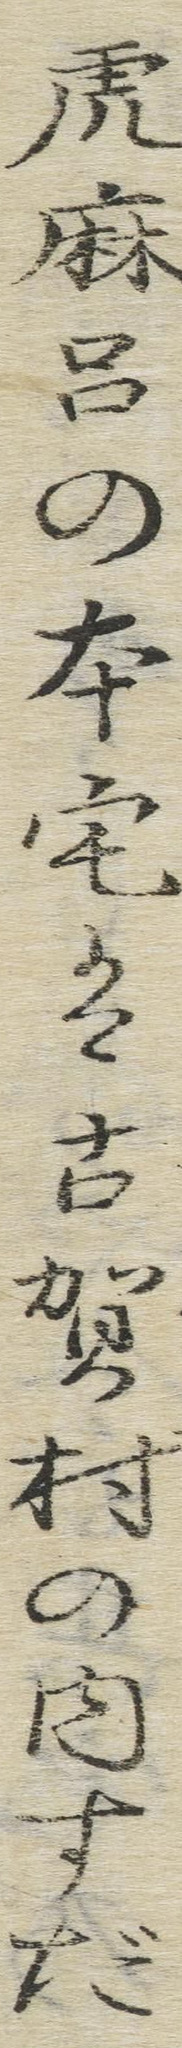虎麻呂の本宅は古賀村の内すだ

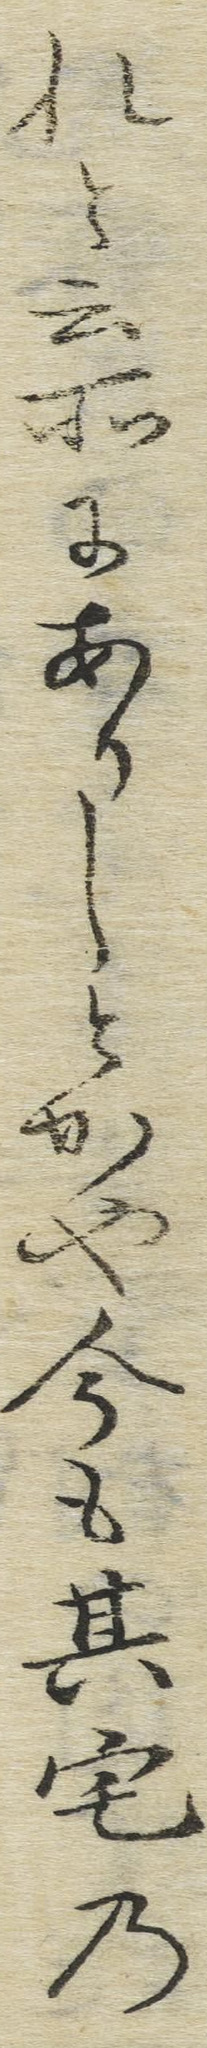れと云所にありとかや今も其宅の
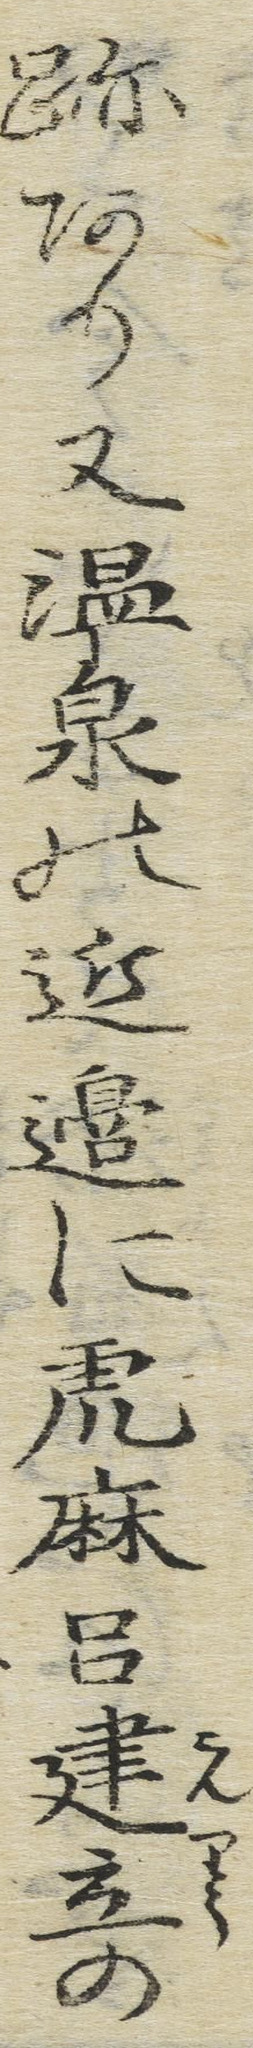跡あり又温泉の近辺に虎麻呂建立の
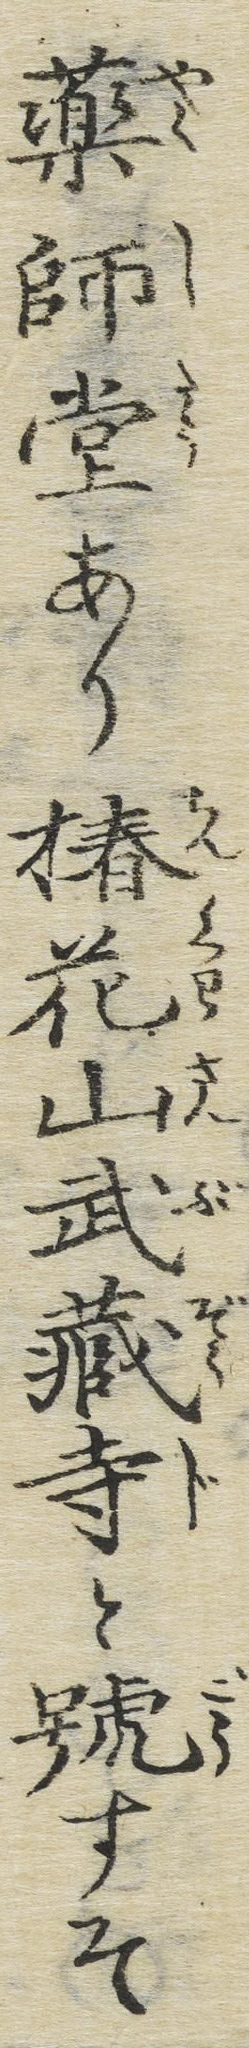薬師堂あり椿花山武蔵寺と号すそ
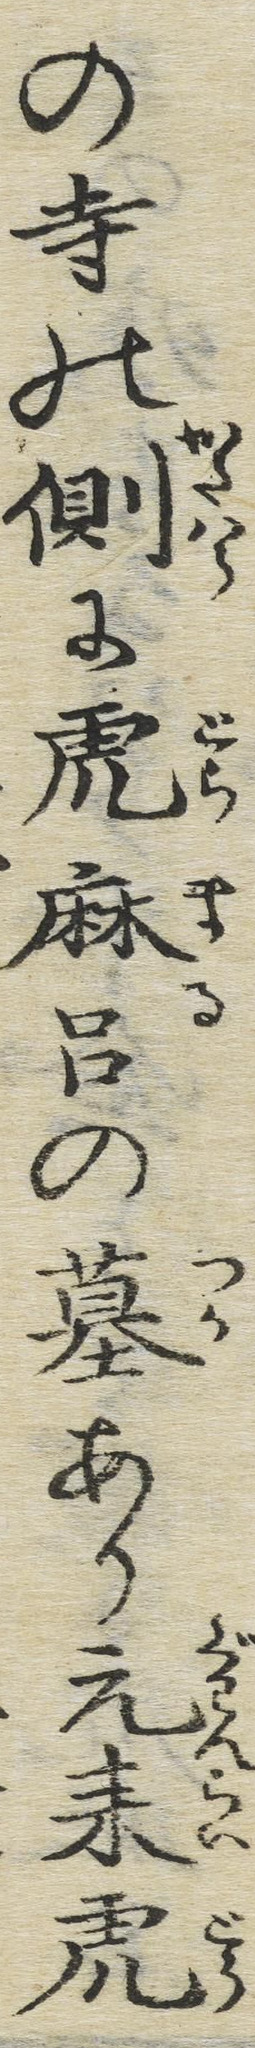の寺の側に虎麻呂の墓あり元来虎
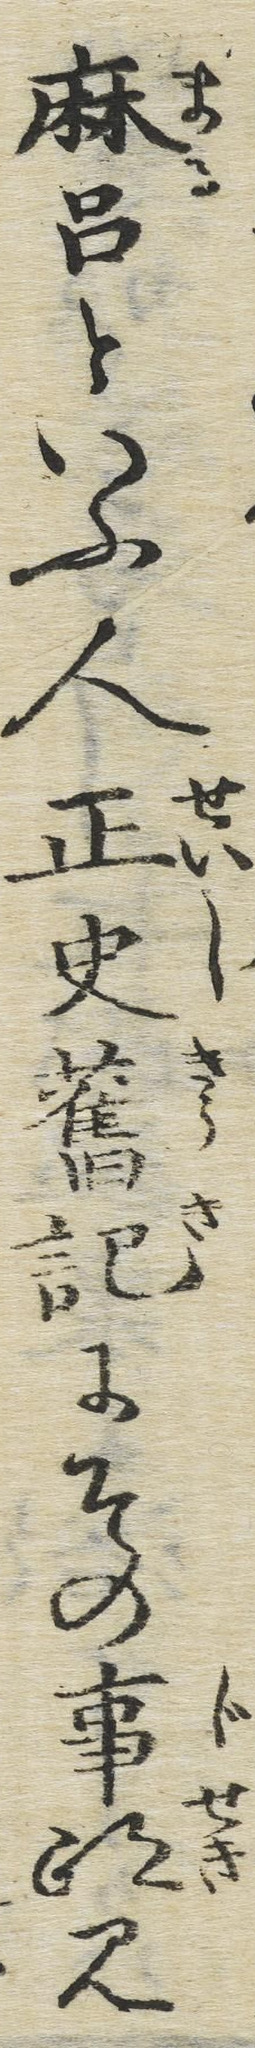麻呂といふ人正史旧記にその事跡見
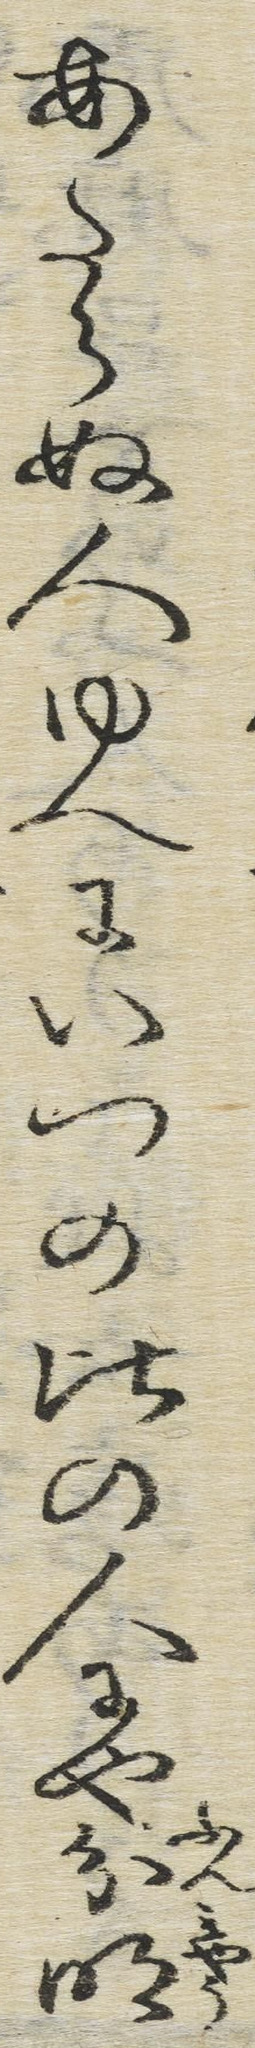あたらぬ人ゆへにいつの頃の人にや分明
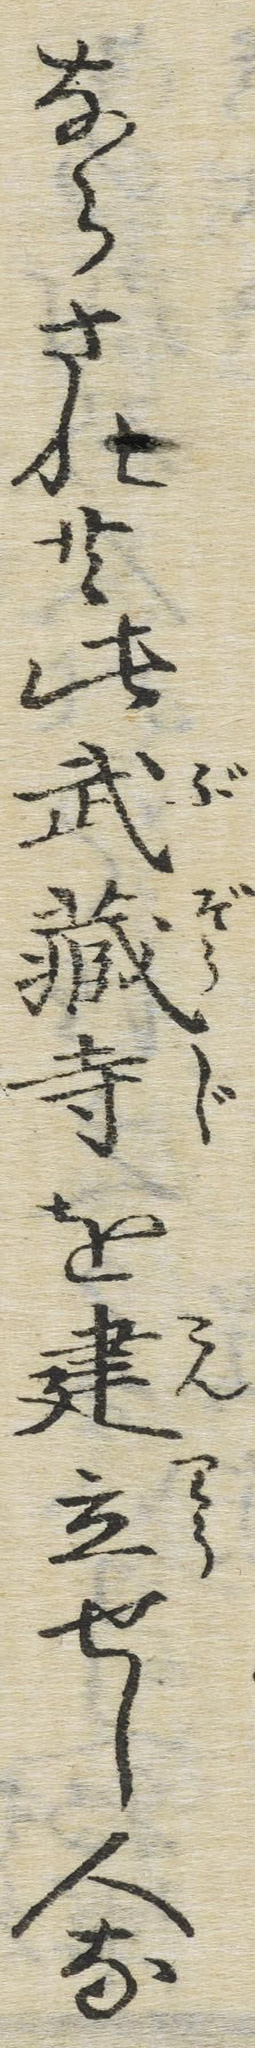なりされ共此武蔵寺を建立せし人な
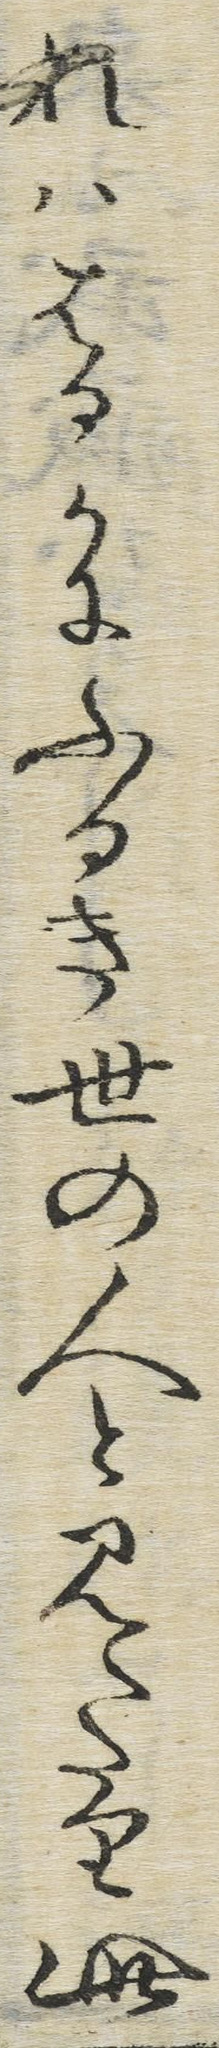れははるかにふるき世の人と見へたり此
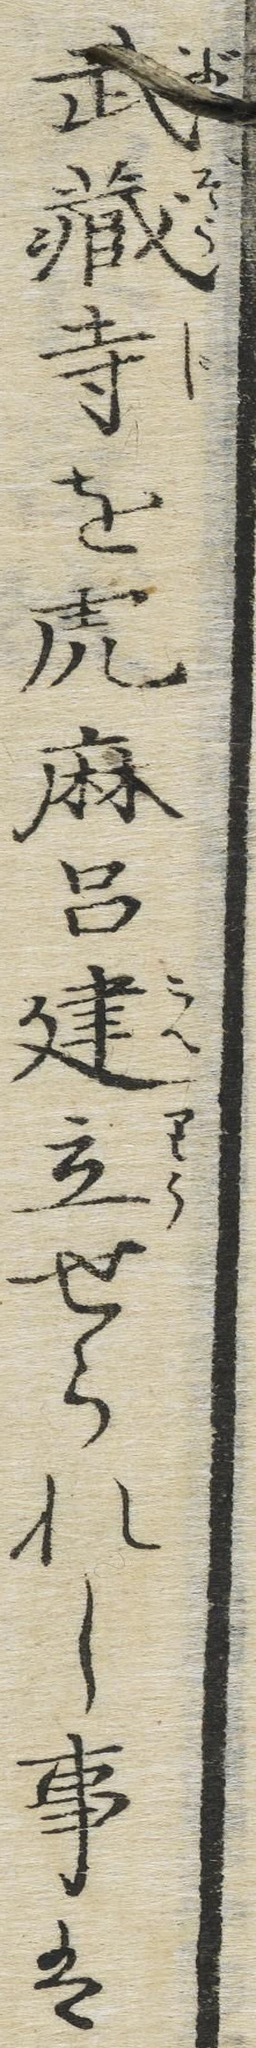武蔵寺を虎麻呂建立せられり事は
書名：温泉考
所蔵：東京大学地震研究所図書室 Earthquake Research Institute Library, The University of Tokyo, JAPAN
